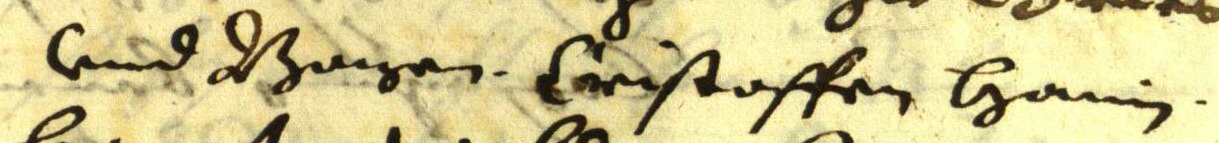vnd Bozen. Cristoffen Haim.
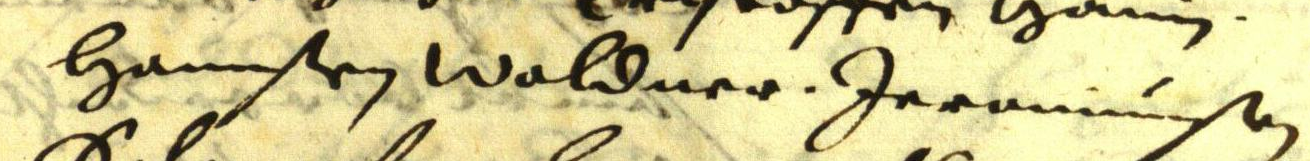Hannsen Waldner, Jeronimūsen
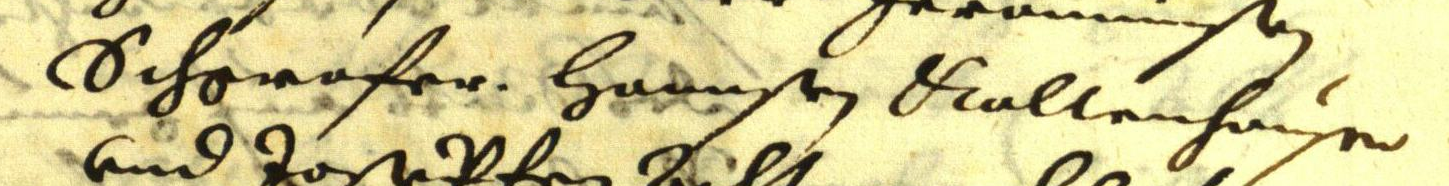Schgrafer. Hannsen Kaltenhaūser
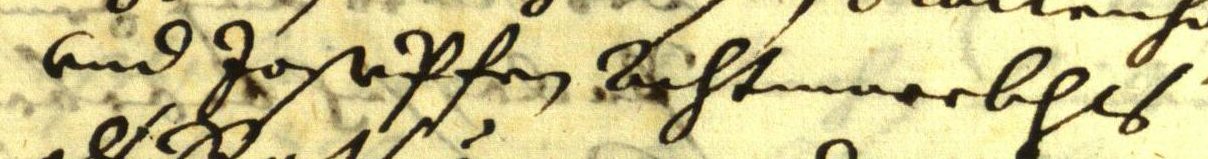vnd Joseffen Achtmarckhts.
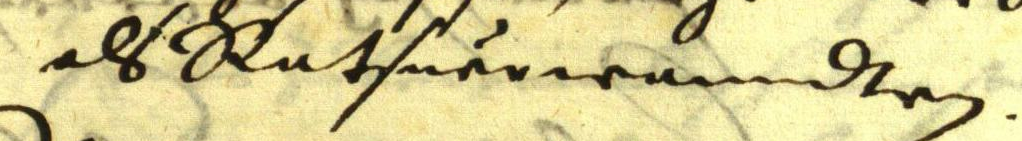als Ratsūerwanndten.
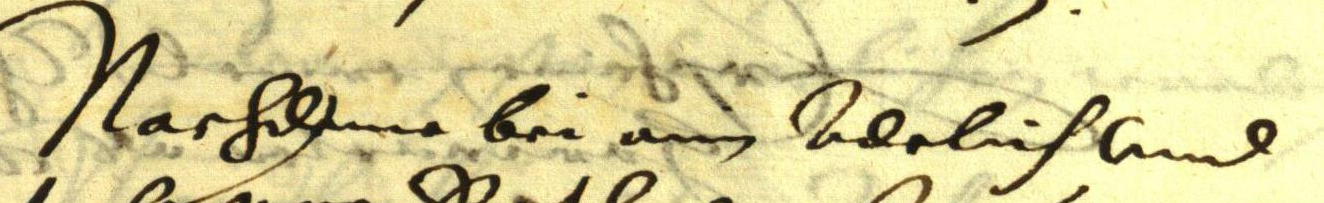Nachdeme bei ain Adelich vnd
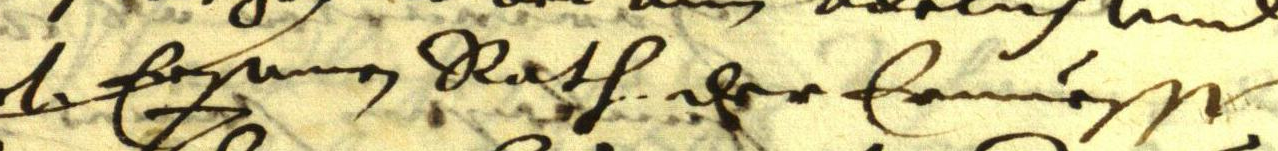Ersamen Rath der Ernūesst
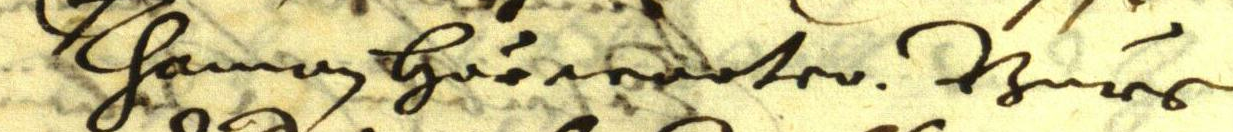Thoman Hōrwarter Būrg
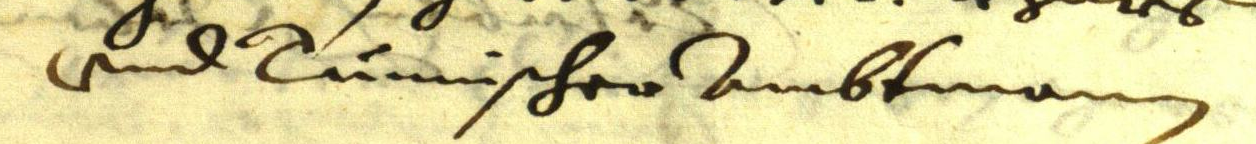vnd Tūnnischer Ambtmann
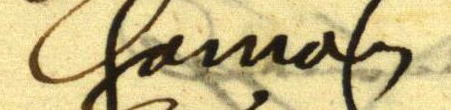Thoman
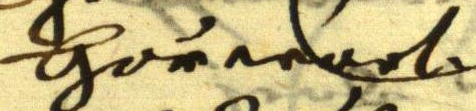Hōrwart¬
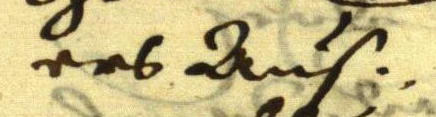ers Aūs¬
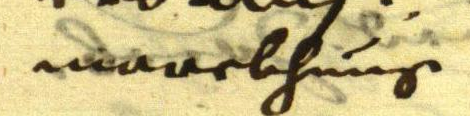marckhūng
